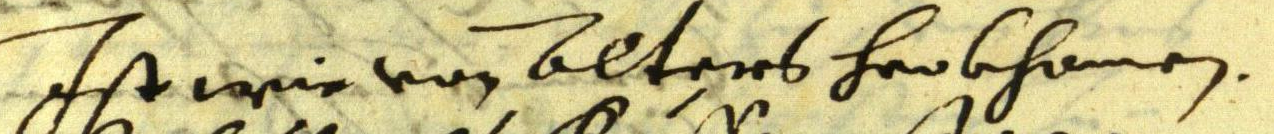Ist wie von Alters herkhomen.
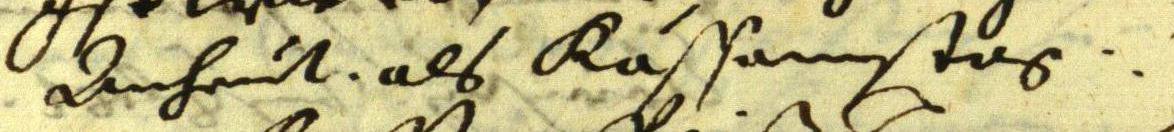Anheūt. als Kāssamstag.
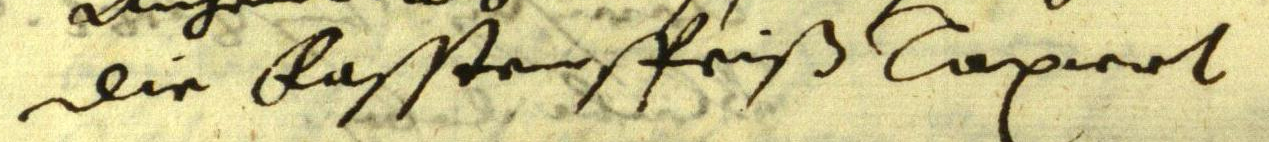Die Fasstenspeiß Taxiert
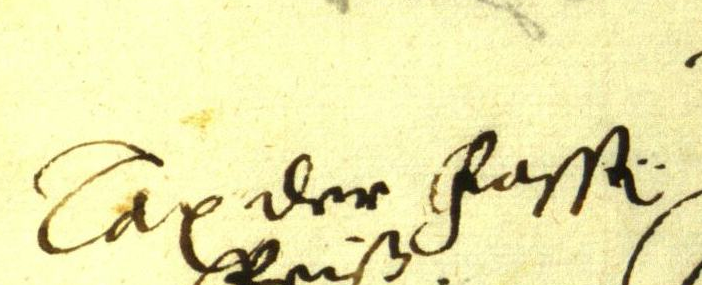Tax der Fasst¬
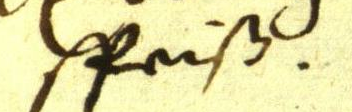speiß.
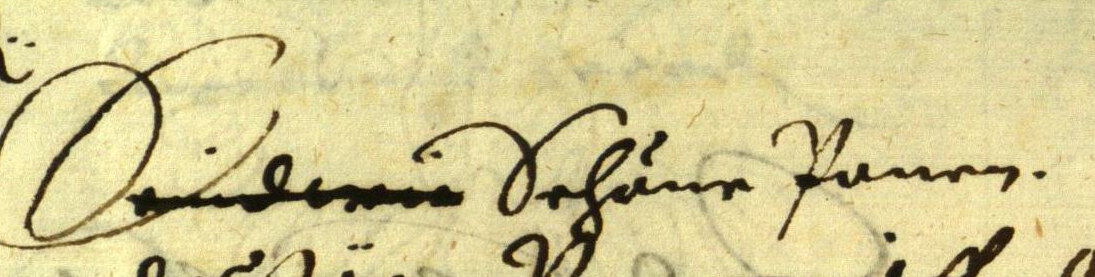Seindwie Schōne Ponen.
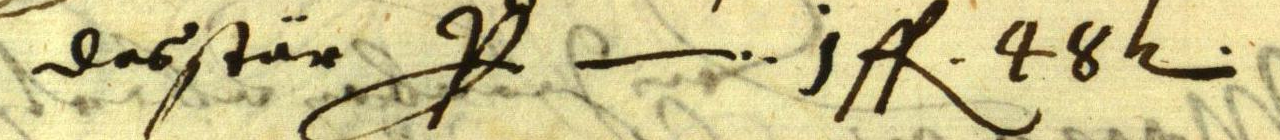das stär P —: 1 fl. 48 k.
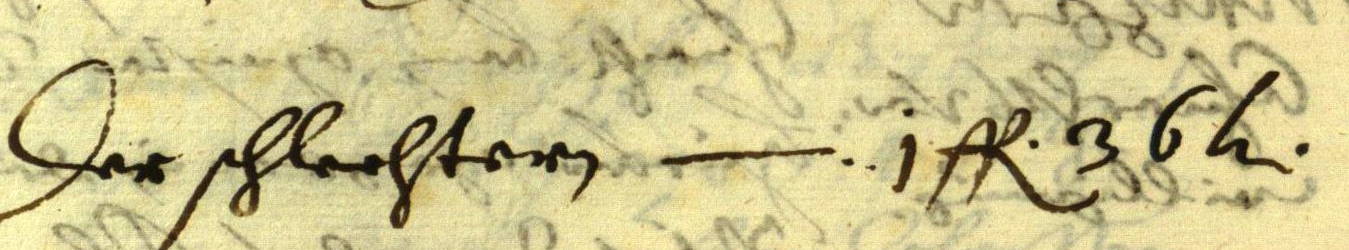Der schlechtern —: 1 fl. 36 k.
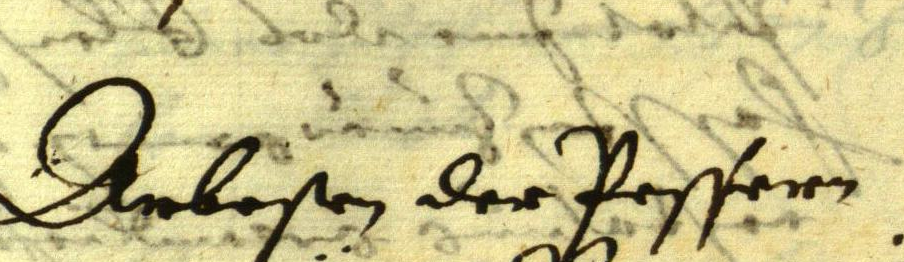Arbesen der Pessern
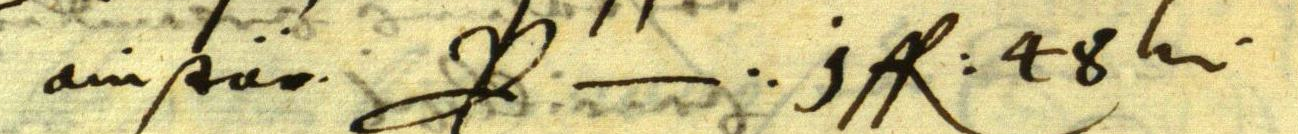ain stär P —: 1 fl. 48 k.
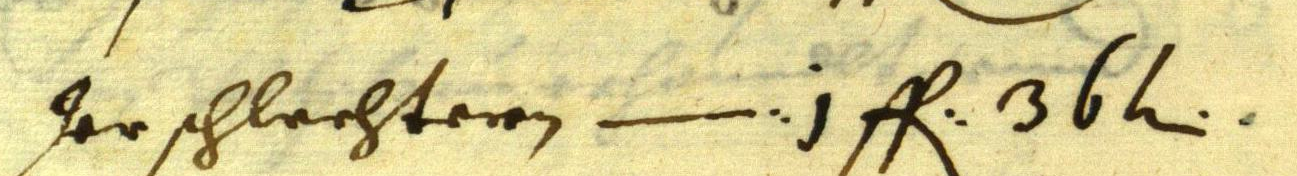der schlechtern —: 1 fl. 36 k.
